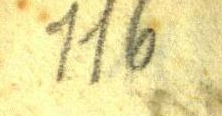116
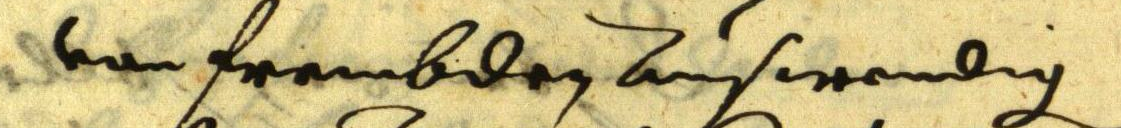von frembden Aūswendig
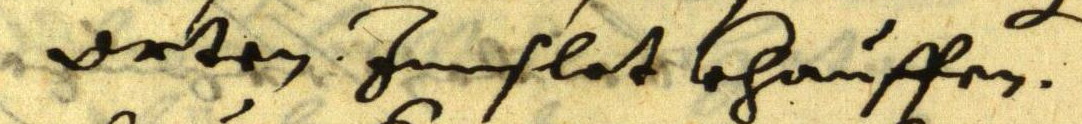Orten Innslot khaūffen.
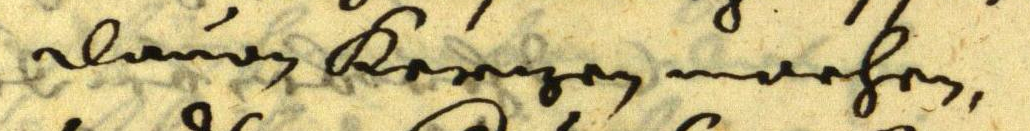daūon Kerzen machen,
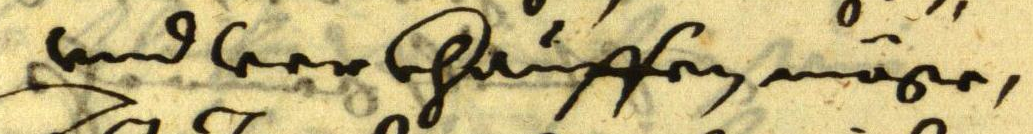vnd verkhaūffen möge,
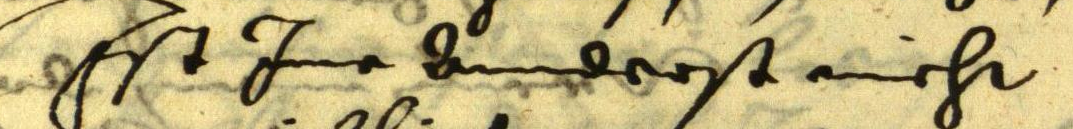Ist Ime Annderst nicht
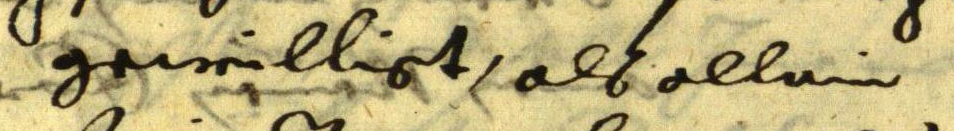gewilligt, als allain
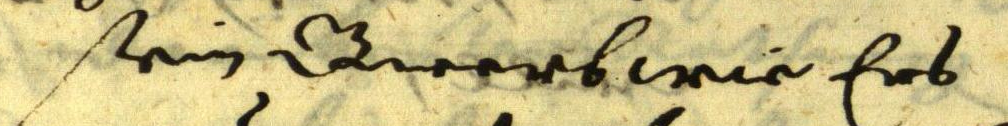sein Gwerb wie Ers
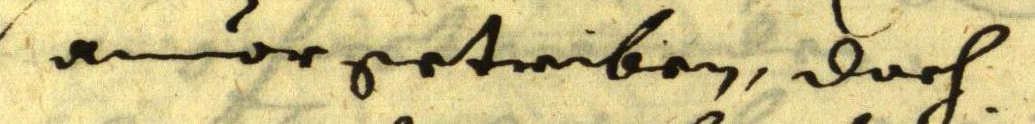anūor getriben, doch
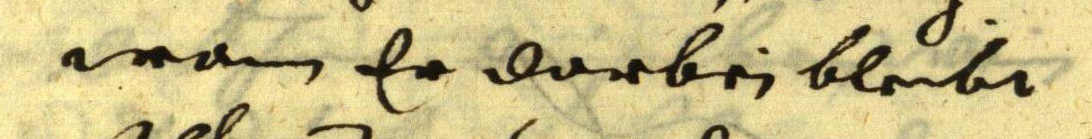wann Er darbei bleibt
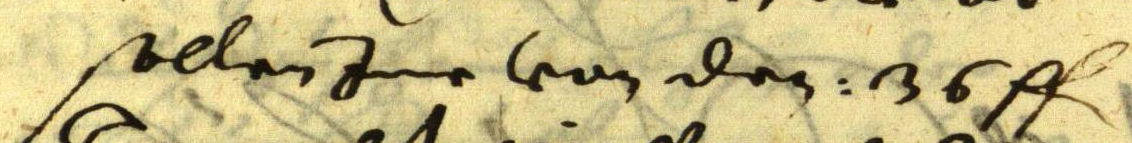sollen Ime von den: 36 fl
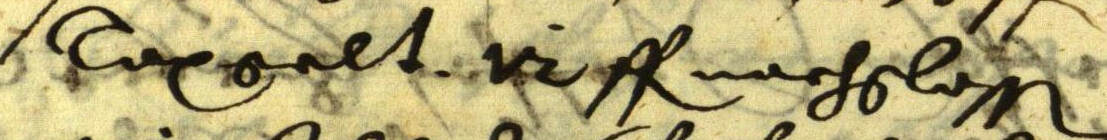Taxgelt. 12 fl nachglass
